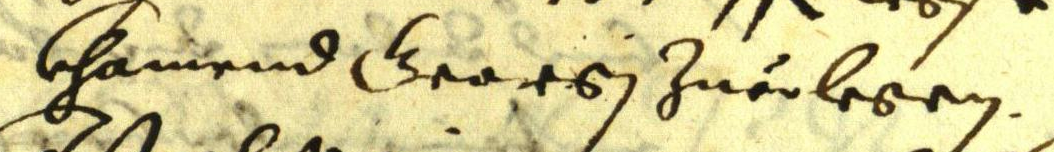khomend Georgj Zuērlegen.
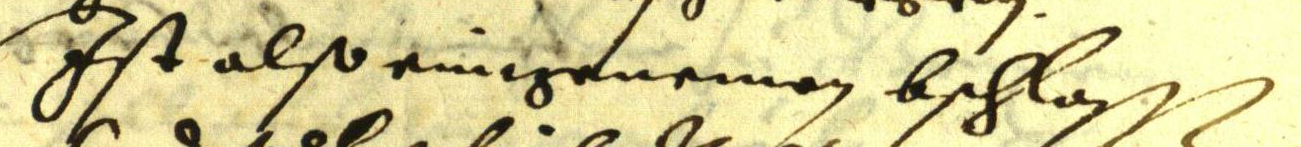Ist also einzenemen bschloss
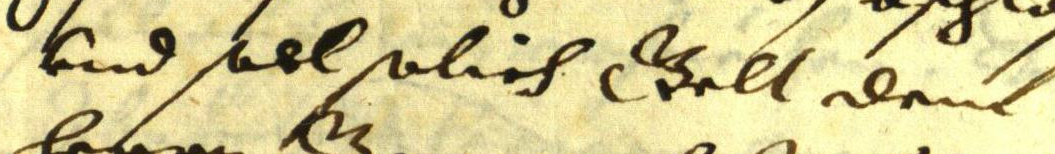vnd soll solich Gelt dem
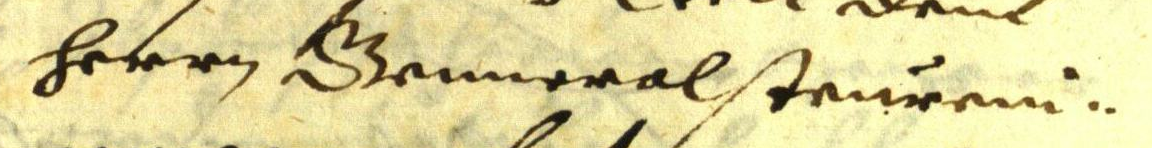herrn Genneralsteūrein¬
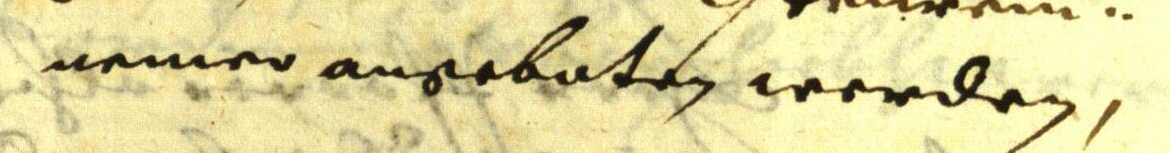nemer angeboten werden,
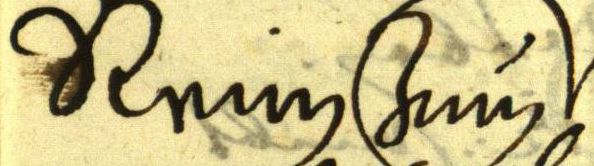Reim Zūm
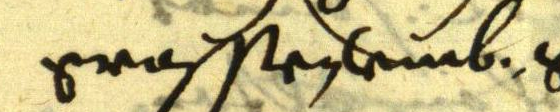grossen vmb¬
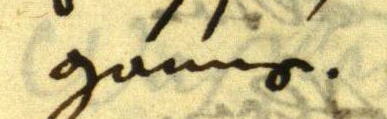ganng.
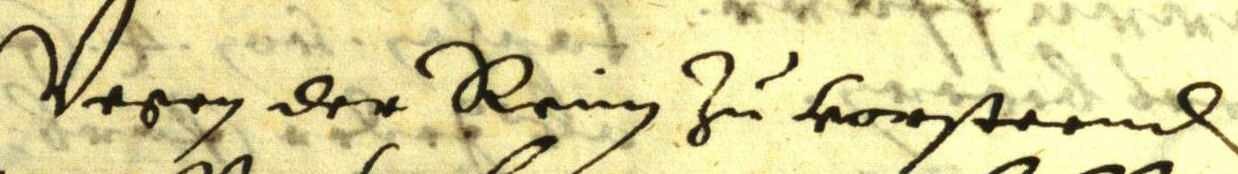Wegen der Reim Zū vorsteend
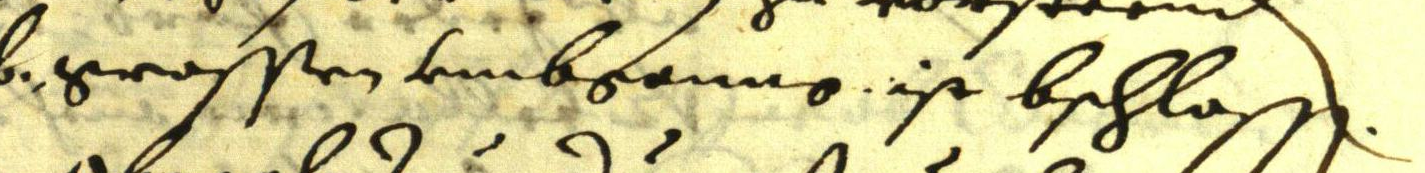grossen vmbganng. ist bschloss
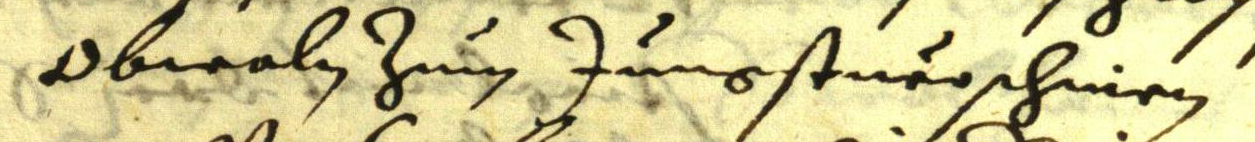Obwoln Zūm Jūngstverschinen
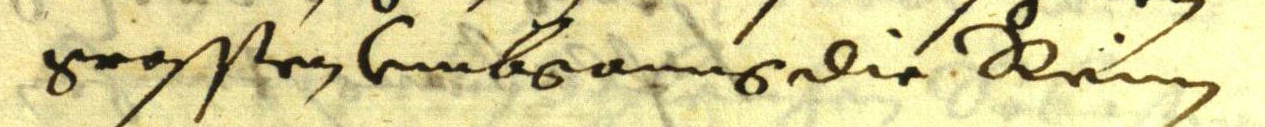grossen vmbganng die Reim
